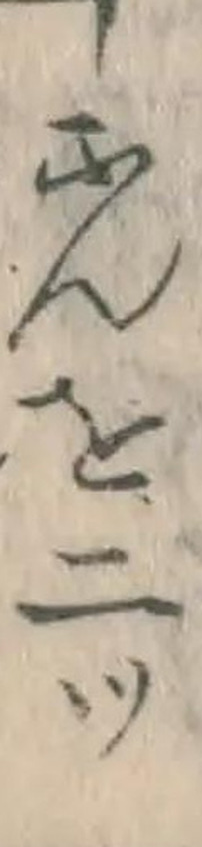ふんを二ツ
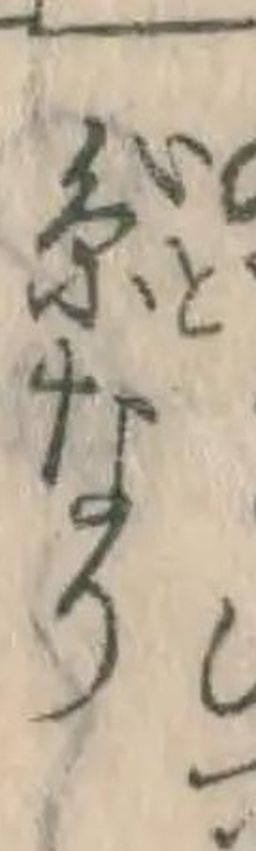糸なり
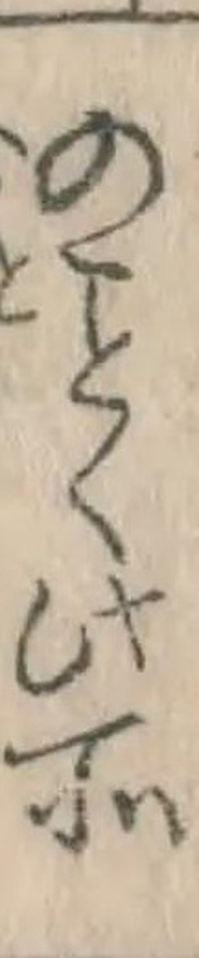のことく此所
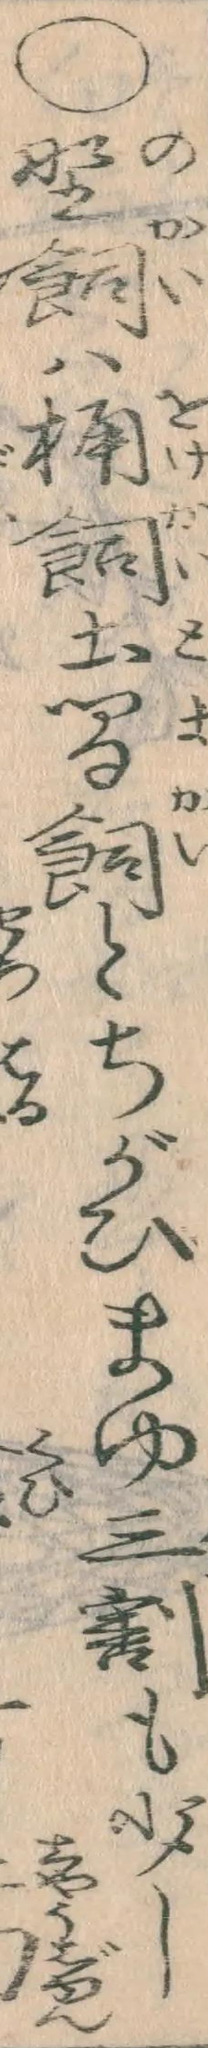○野飼は桶飼土間飼とちがひまゆ三割も少し
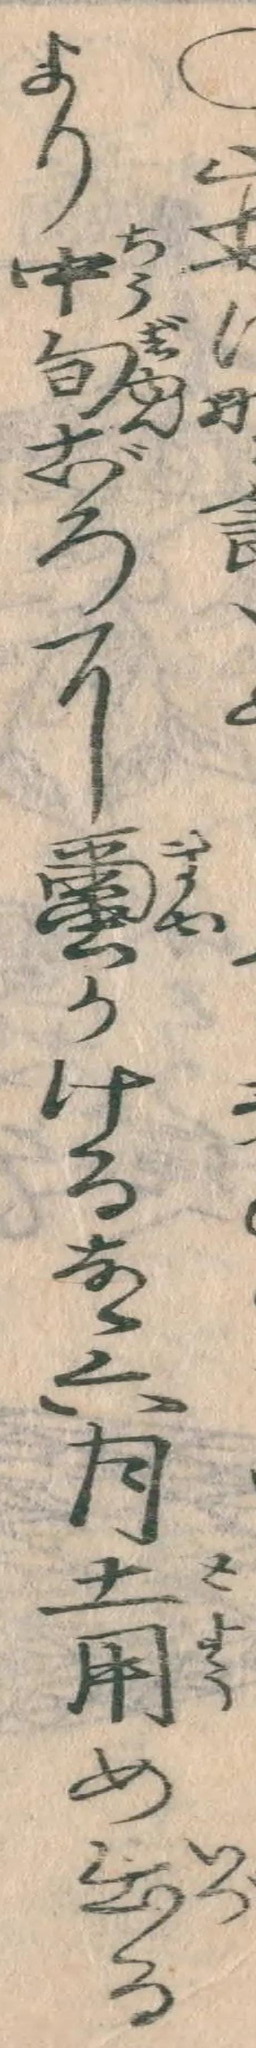より中旬ごろに繭かける故六月土用め出る
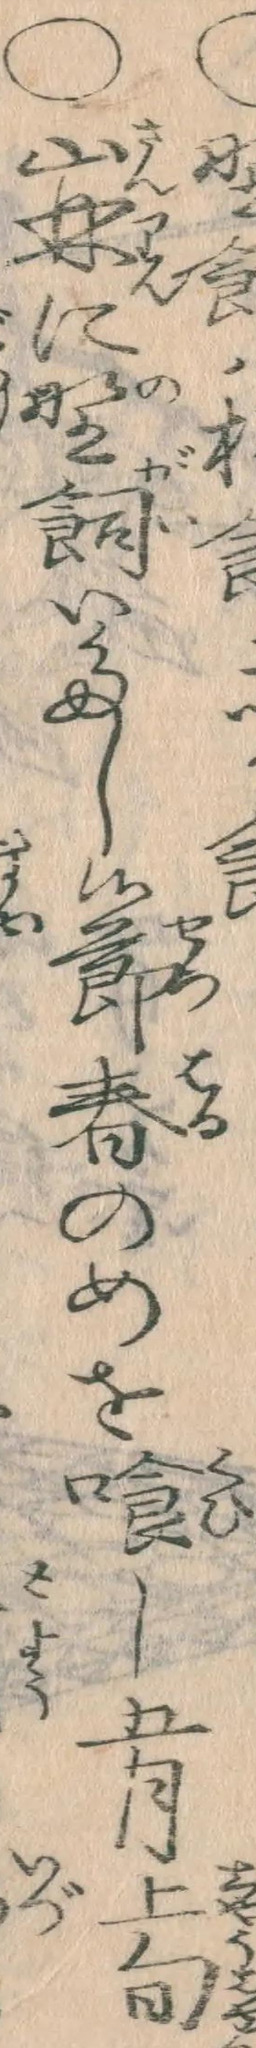○山林に野飼いたし候節春のめを喰し五月上旬
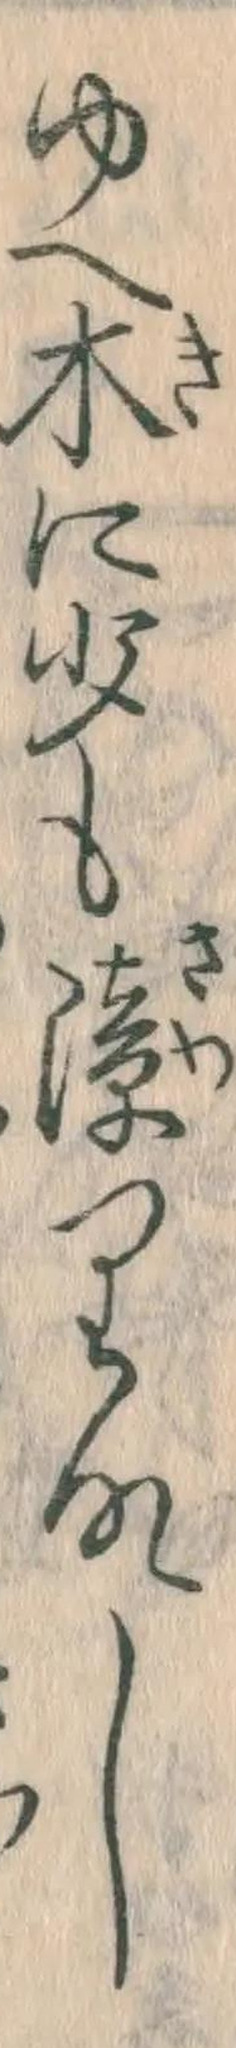ゆへ木に少も障りなし
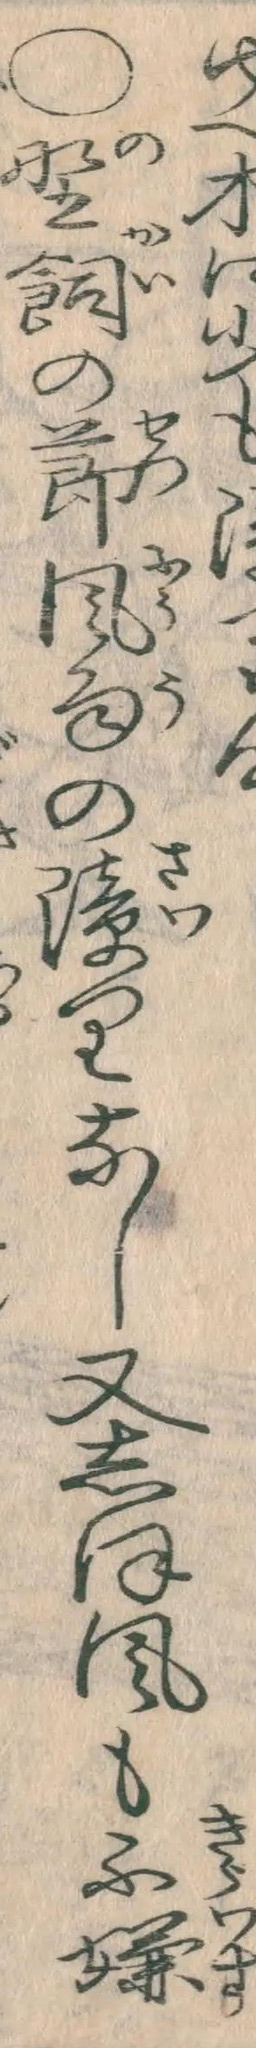○野飼の節風雨の障りなし又しほ風も不嫌
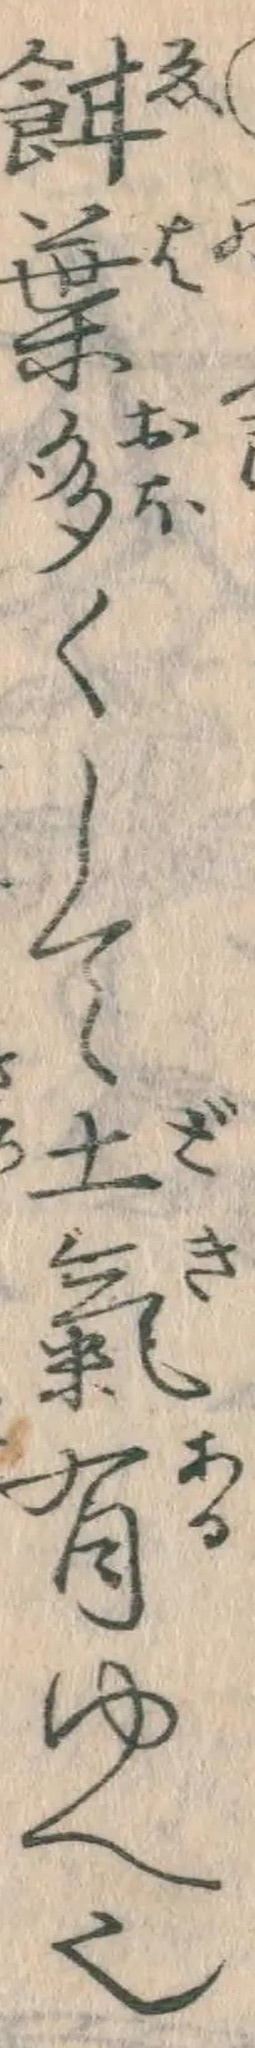餌葉多くして土気有ゆへ也
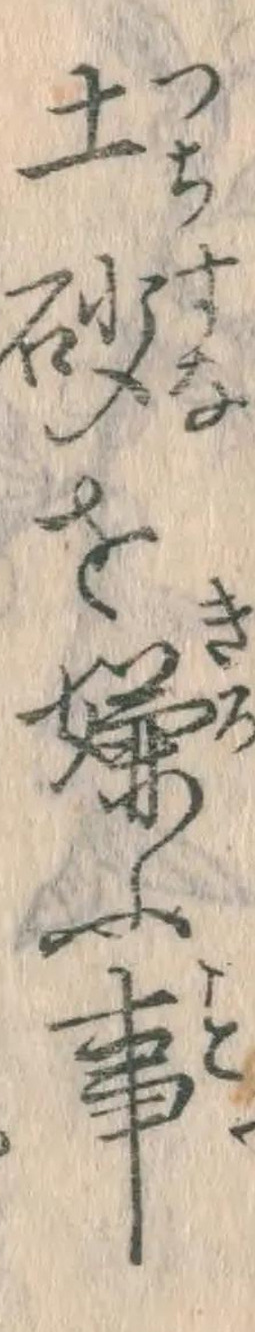土砂を嫌ふ事
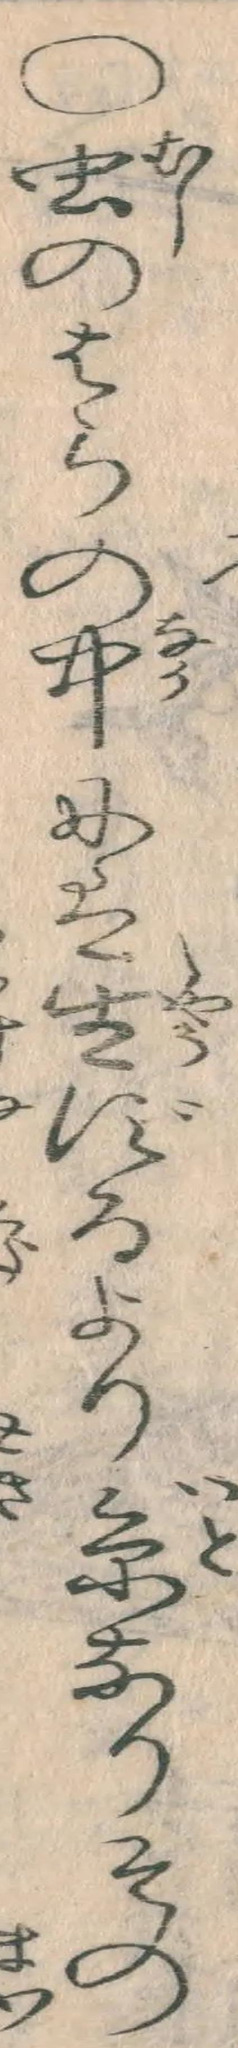○虫のはらの中にて生ずるより糸なりその
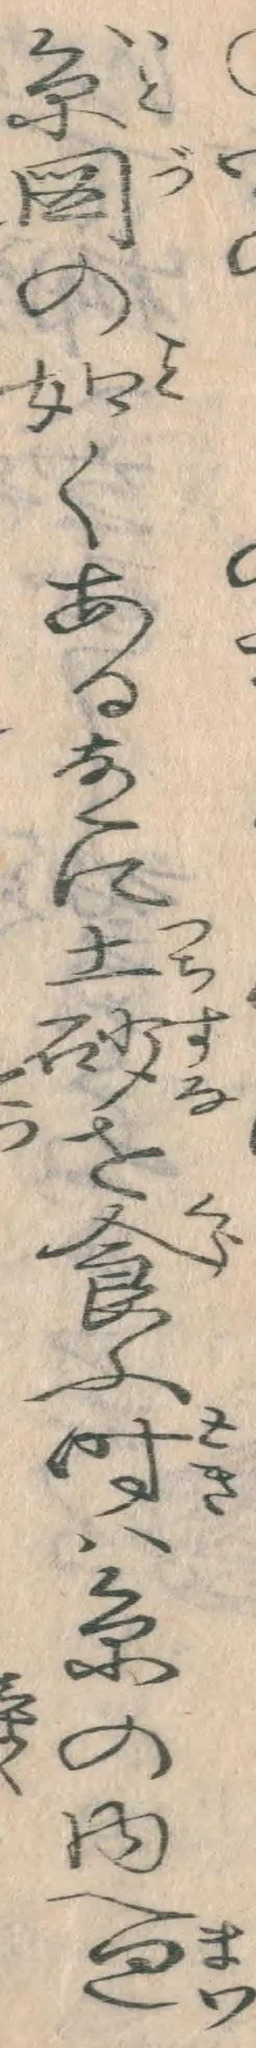糸図の如くある故に土砂を食ふ時は糸の内へ廻
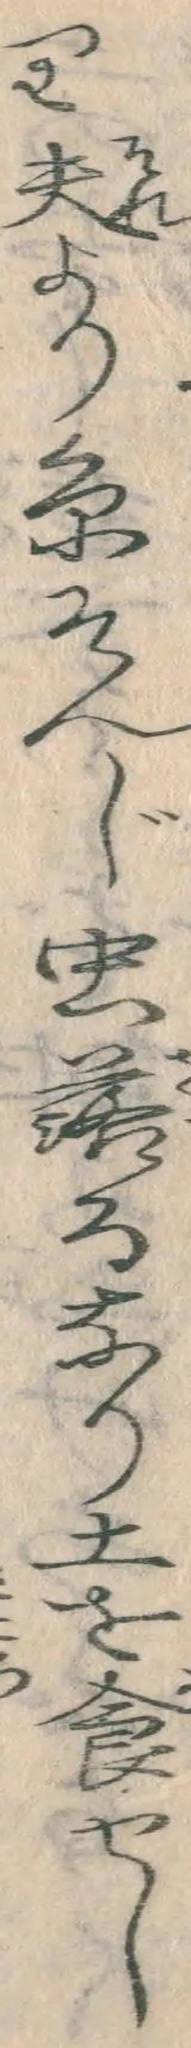り夫より糸そんじ虫落るなり土を食せし
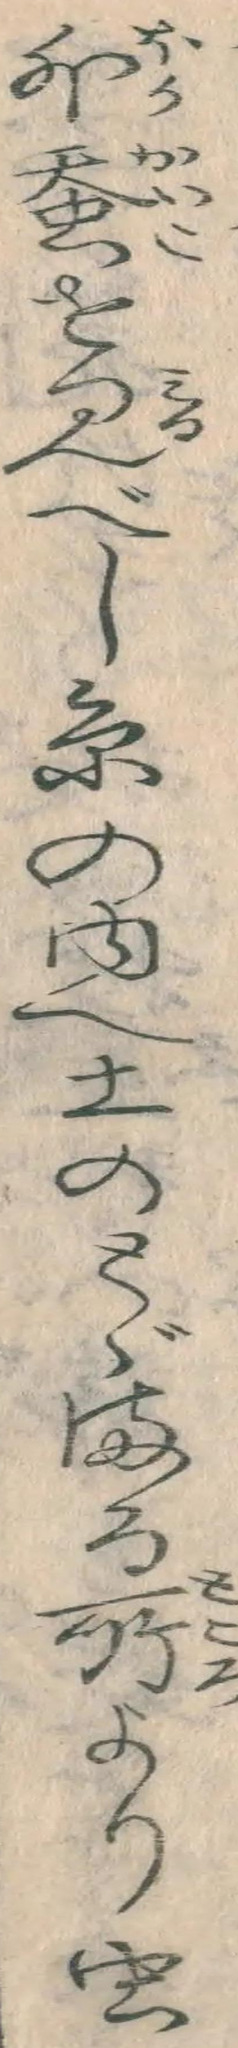外蚕を見べし糸の内へ土のとゞまる所より虫

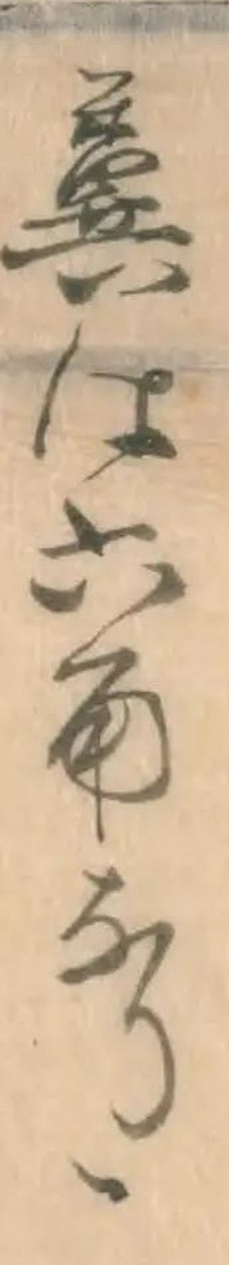糞は六角なり
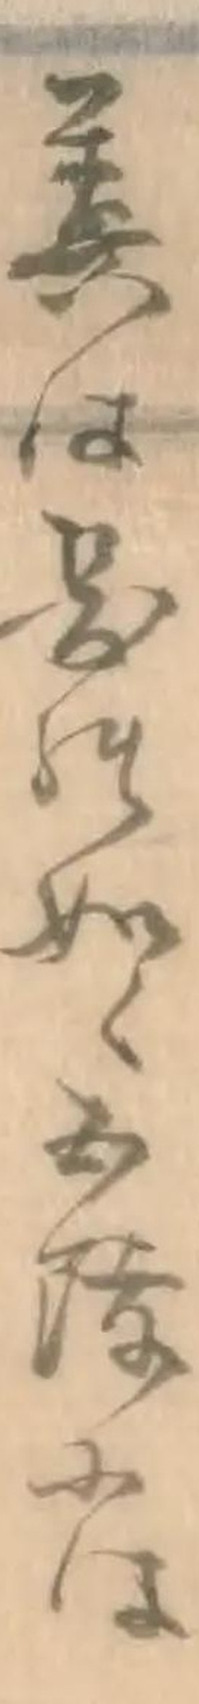糞は図の如く五陵には
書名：山繭養法秘傳抄
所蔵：国立国会図書館 National Diet Library, JAPAN
